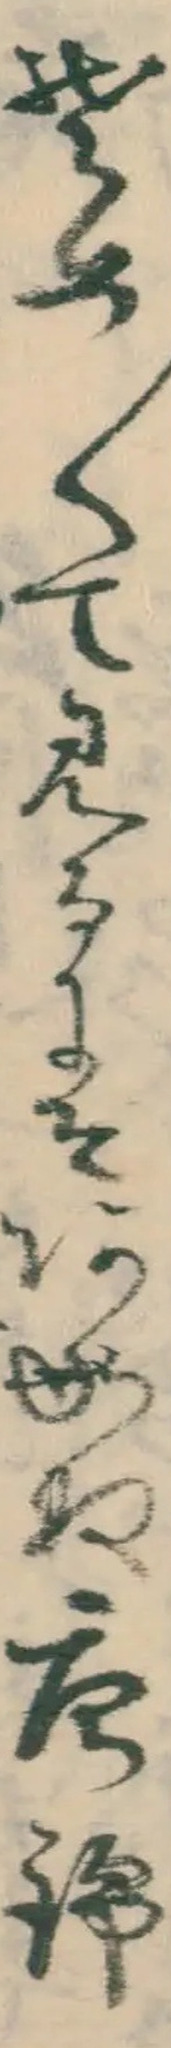そめ〳〵て見るにそあぬ唐錦
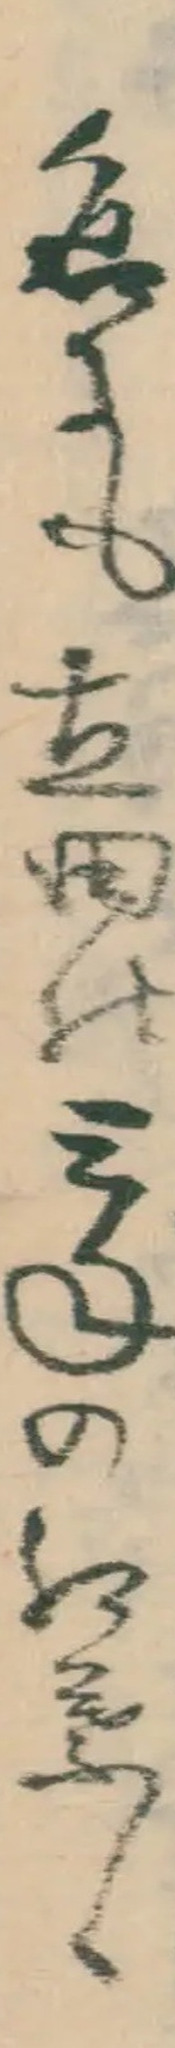色にも立田のみねの紅葉々

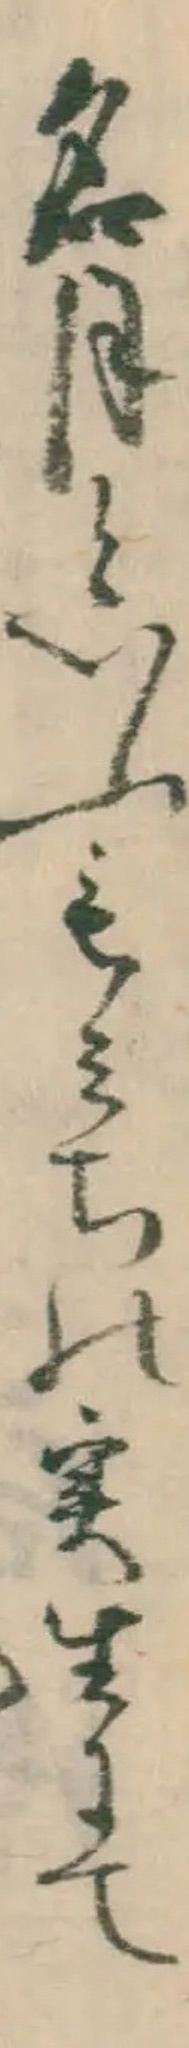待宵名月といふもみちの実生にて
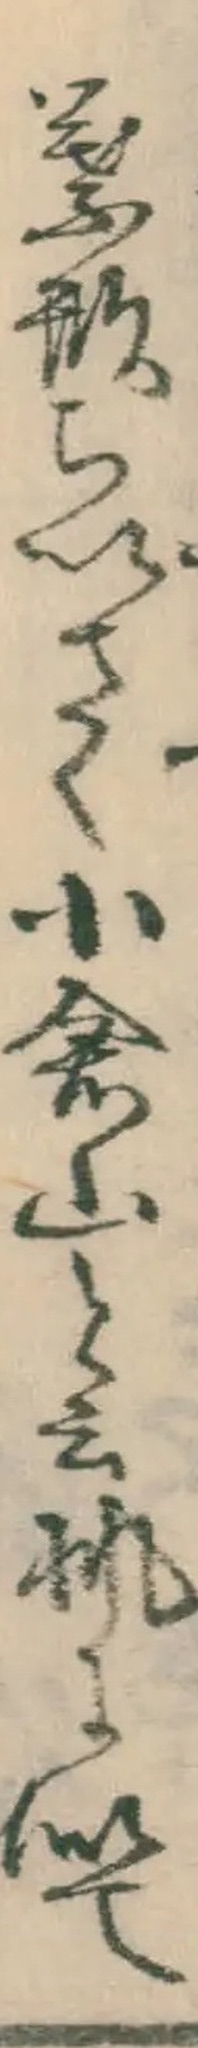葉形ちいさく小倉山と云楓に似て
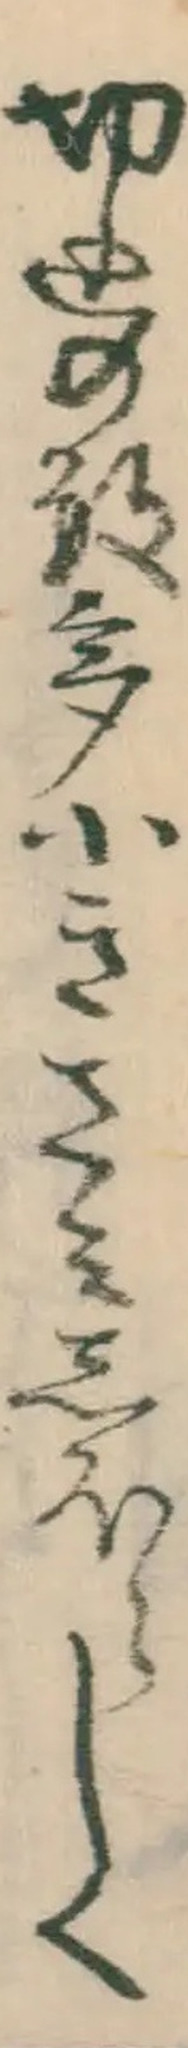切込の数多小きさみしほらしく
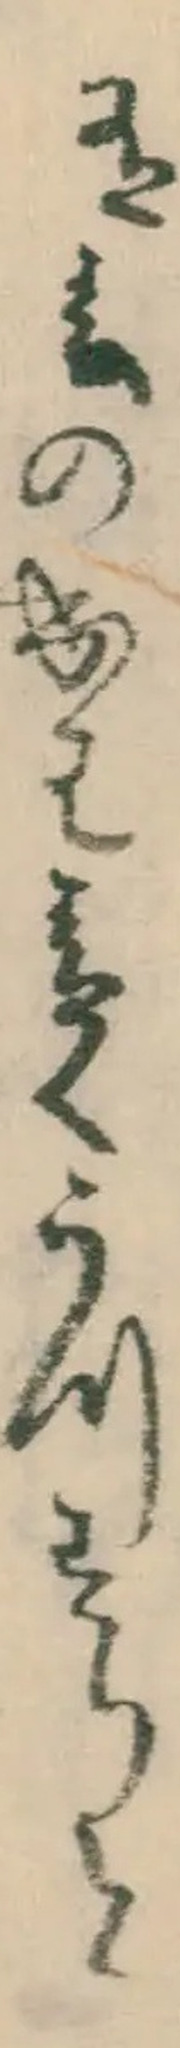有春の出は青くうつすりと
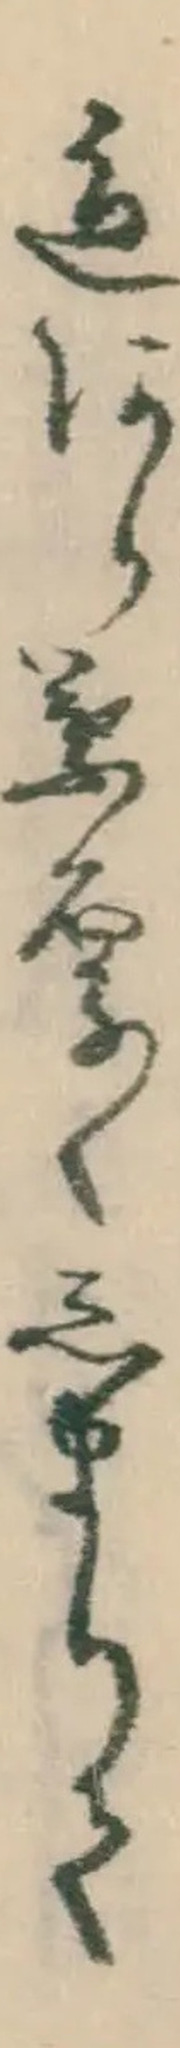色あり葉厚くしまりて
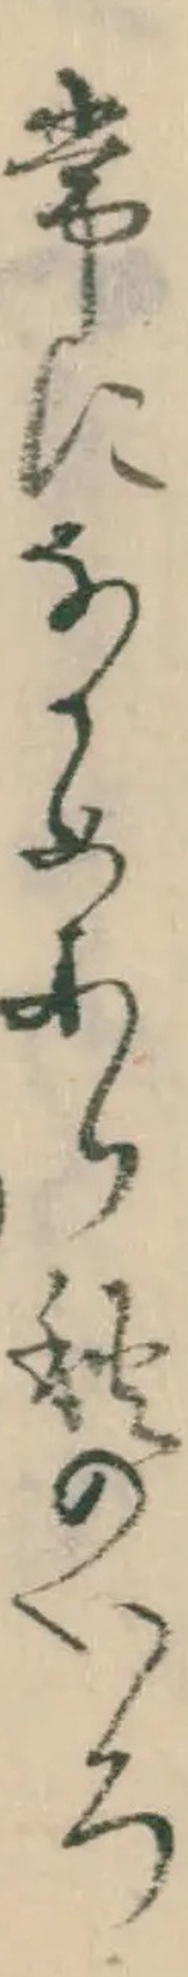常になかめあり秋のいろ
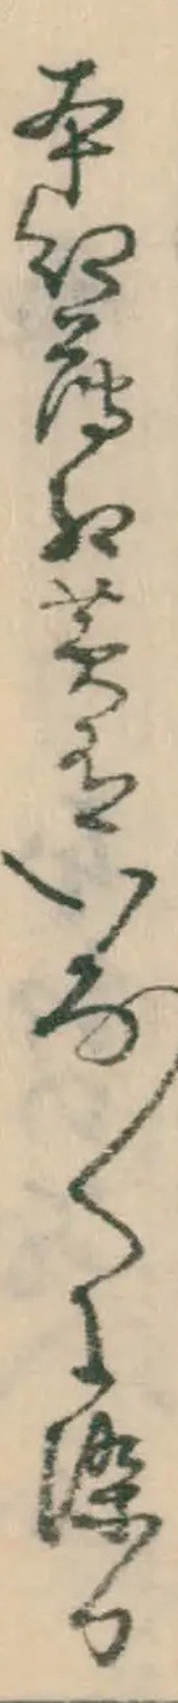本紅薄紅黄有いろ〳〵に染る
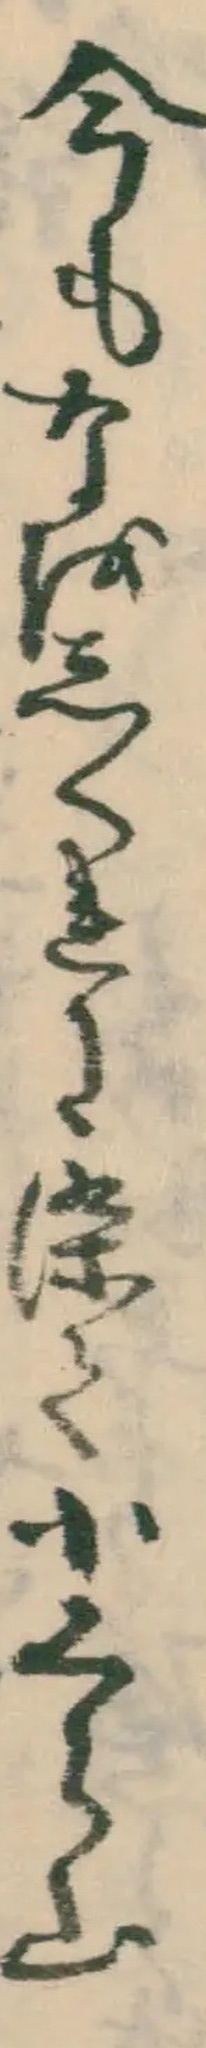今もなをしくれに染て小くら山
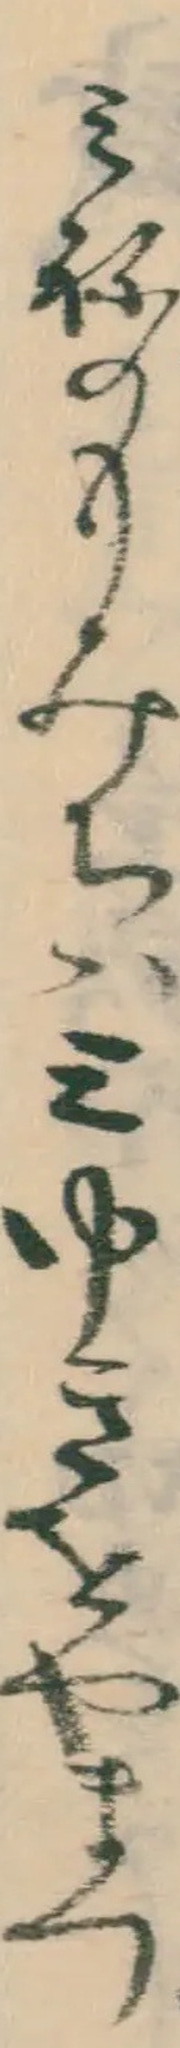みねのもみちはみゆきをやまつ
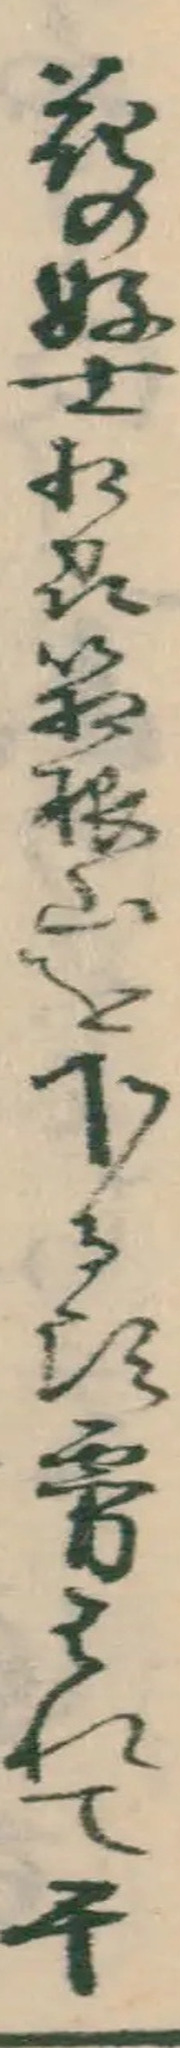夕霧花の好士相州箱根山を下る頃霧はれて千
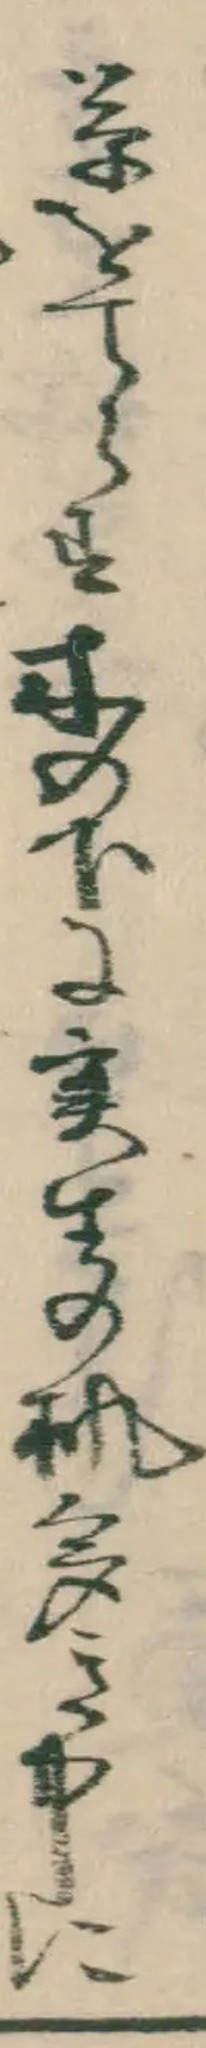草をてらす木の下に実生の楓多き中に
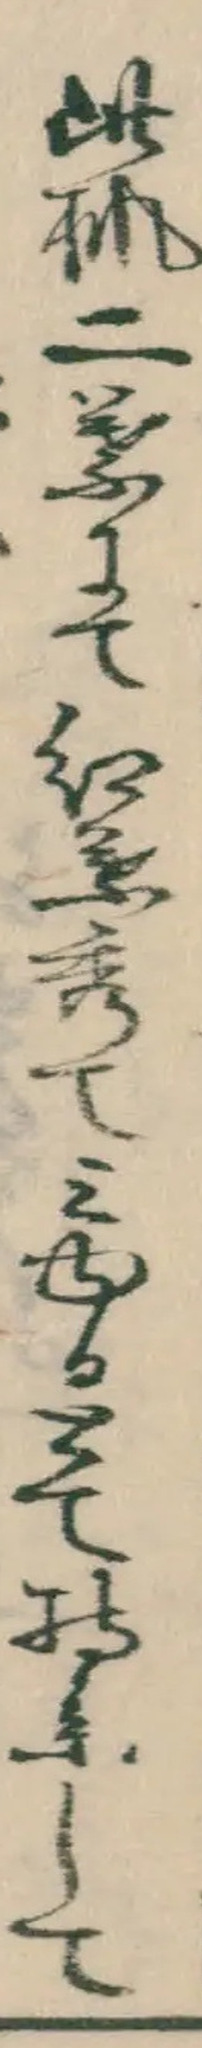此楓二葉にて紅葉秀てみゆるとて持来して
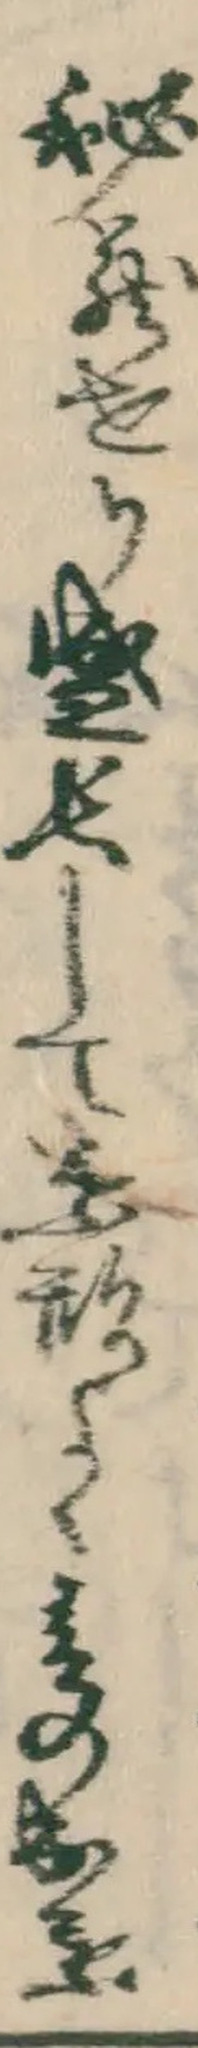秘蔵せり盛長して葉形よく春の出葉
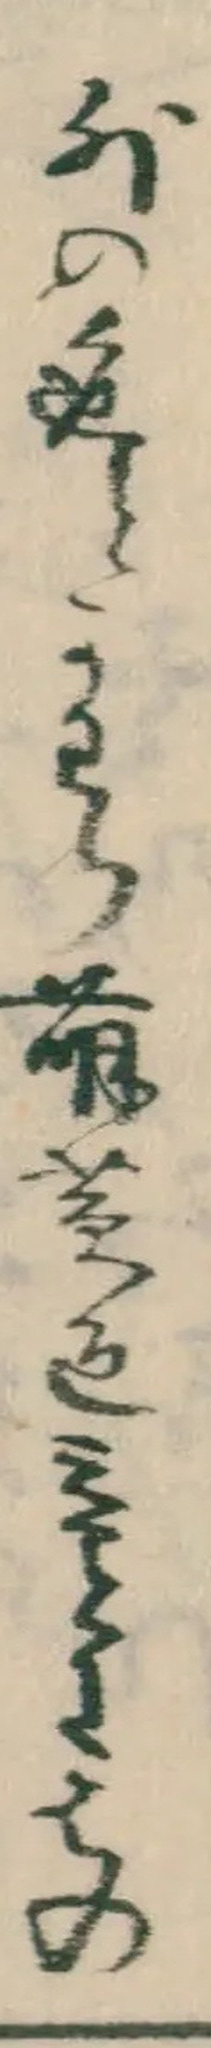外の色とかわり萌黄色みことにはの
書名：紅葉集
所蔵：国立国会図書館 National Diet Library, JAPAN
